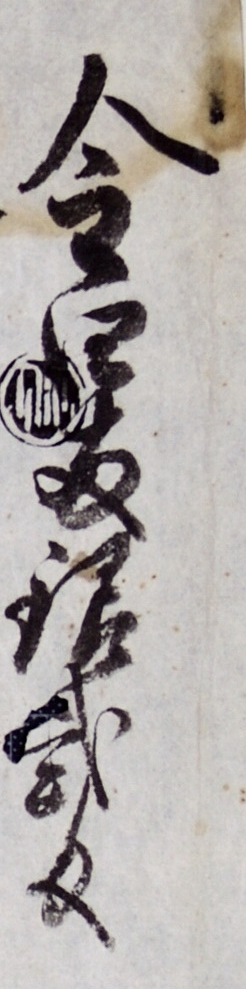金四両銀弐匁
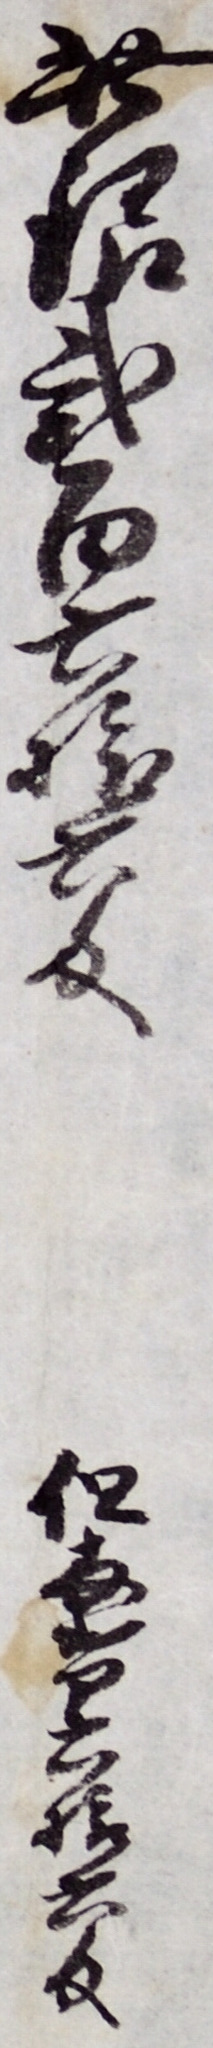此銀弐百六拾六匁但両替六拾六匁
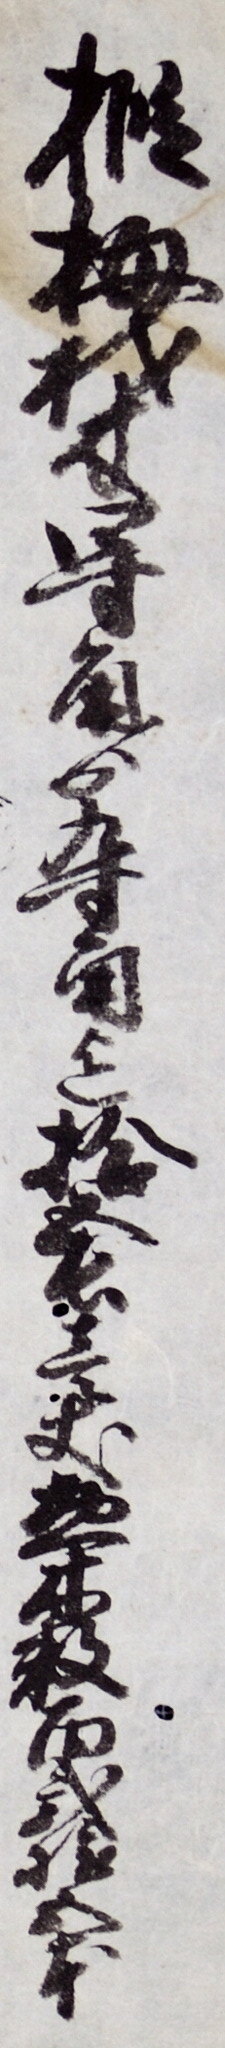椴栂材木四寸角ヨリ九寸角迄拾五長壱丈惣木数百弐拾五本
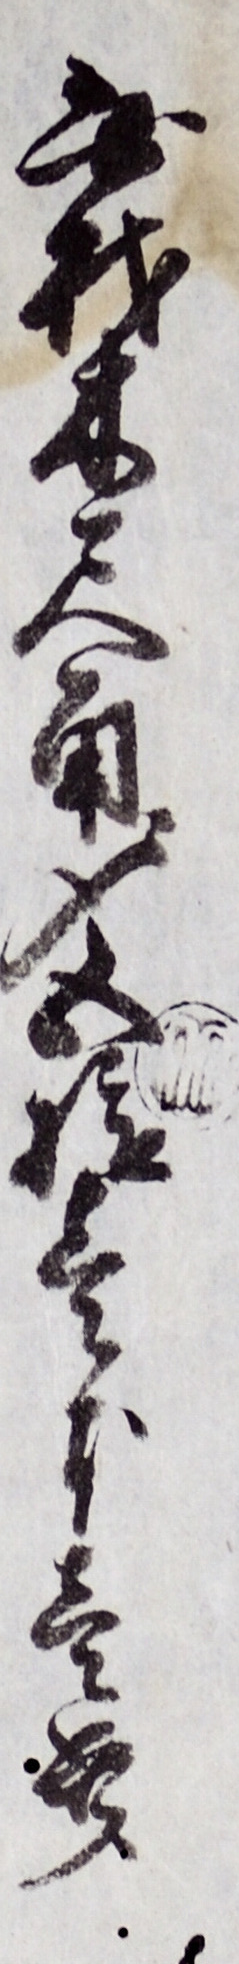此材木尺角〆五拾壱本壱歩
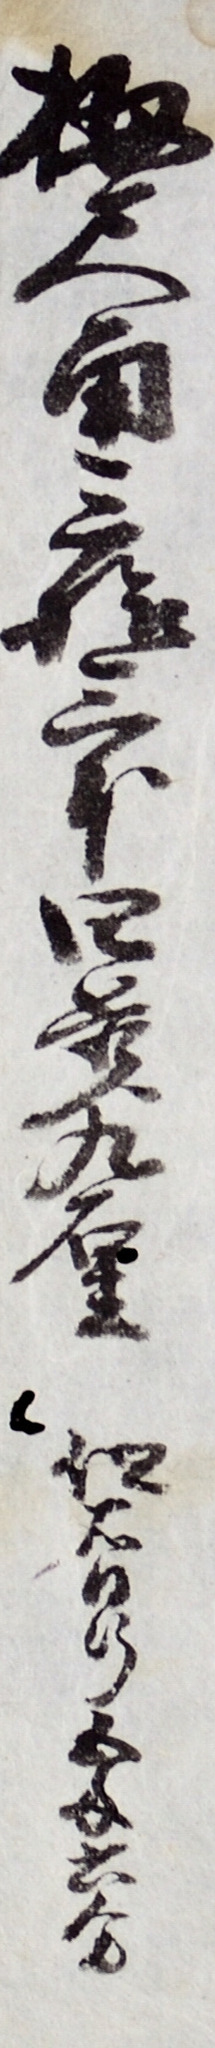栂尺角三拾三本四歩九厘但右同断五匁六分
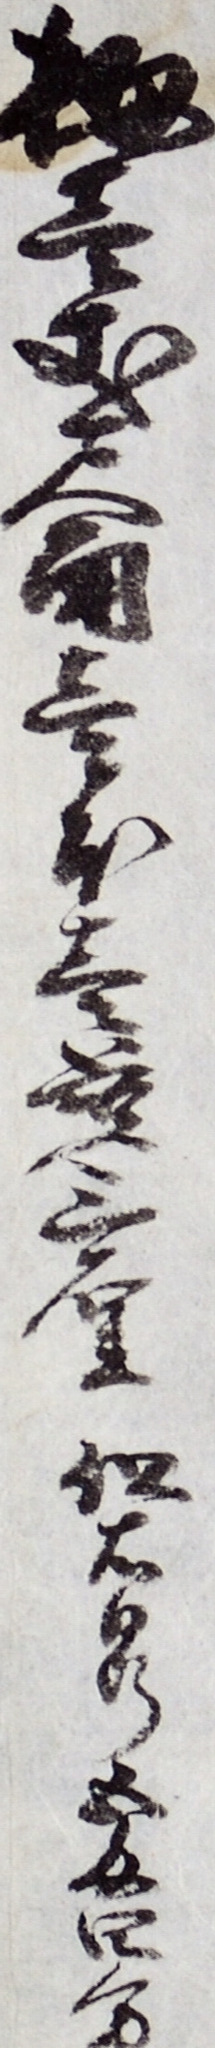栂壱丈尺角壱本壱歩三厘但右同断五匁四分
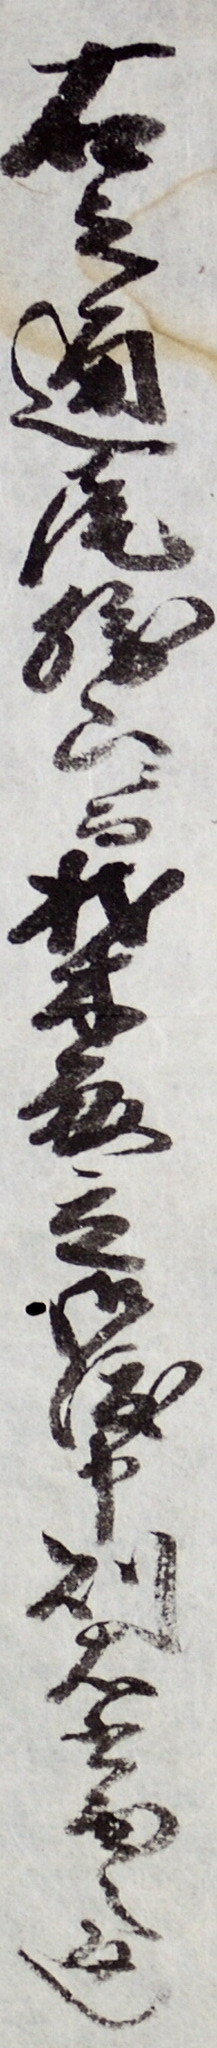右之通尾勝山ニ而材木取立御渡申則右書面之通
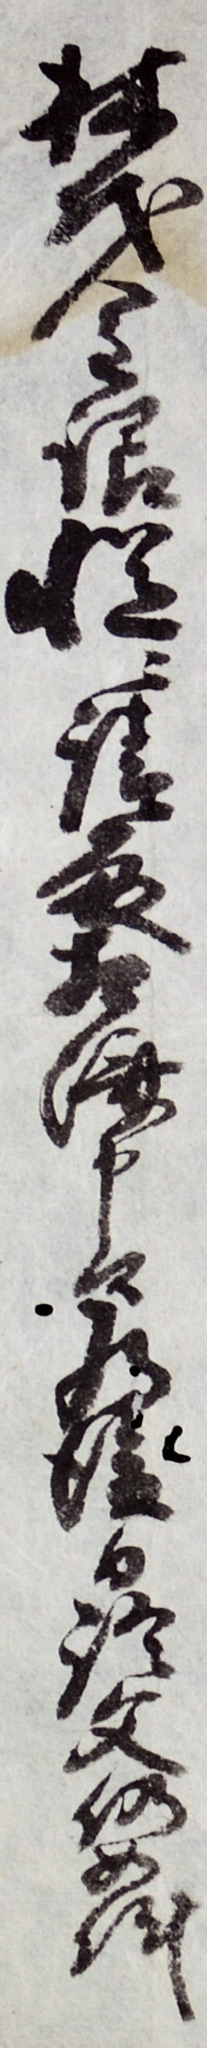林代金銀慥ニ請取相済申候為後日証文仍如件
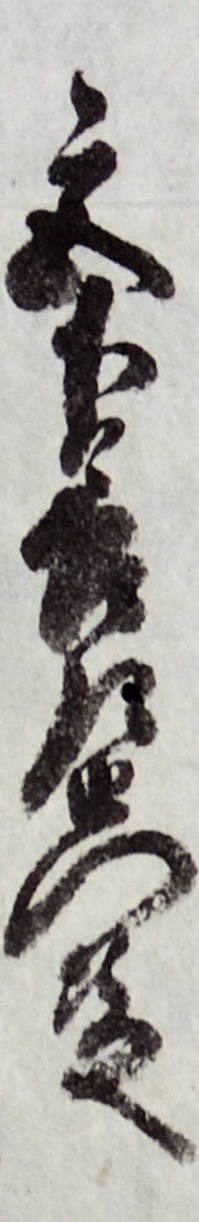宮下善左衛門殿
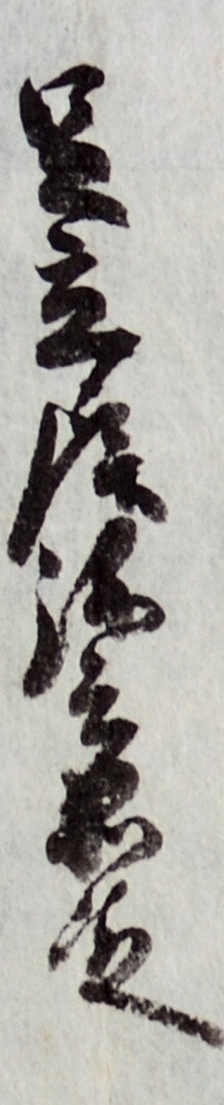足立屋弥兵衛殿
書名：覚
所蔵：伊那市立高遠町図書館・合同会社AMANE
